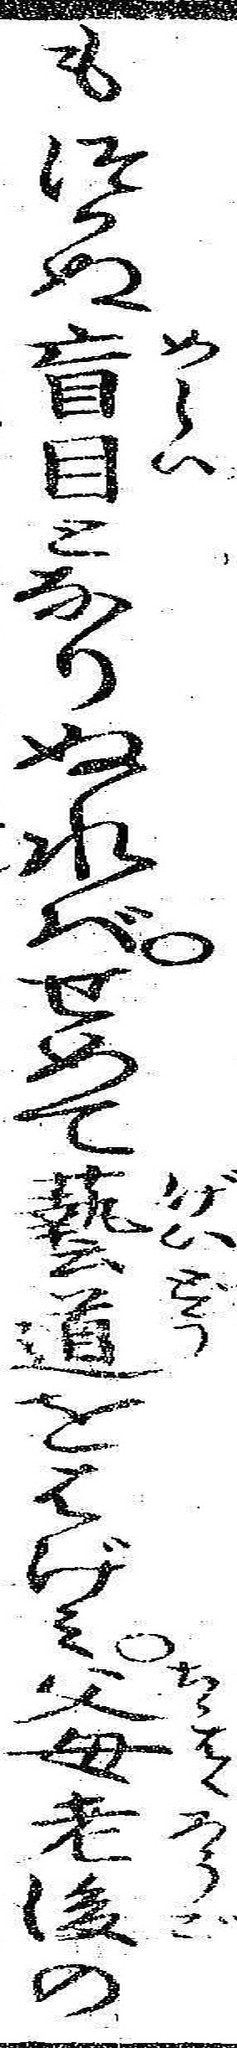もつかぬ盲目となりぬれば。せめて芸道をはげみ。父母老後の
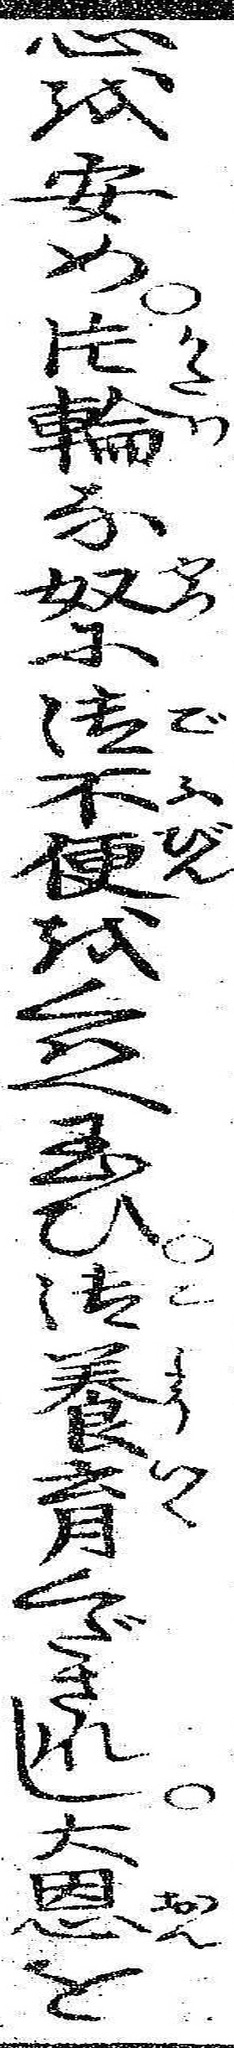心を安め。片輪な奴に御不便をくはへ玉ひ。御養育くだされし。大恩を
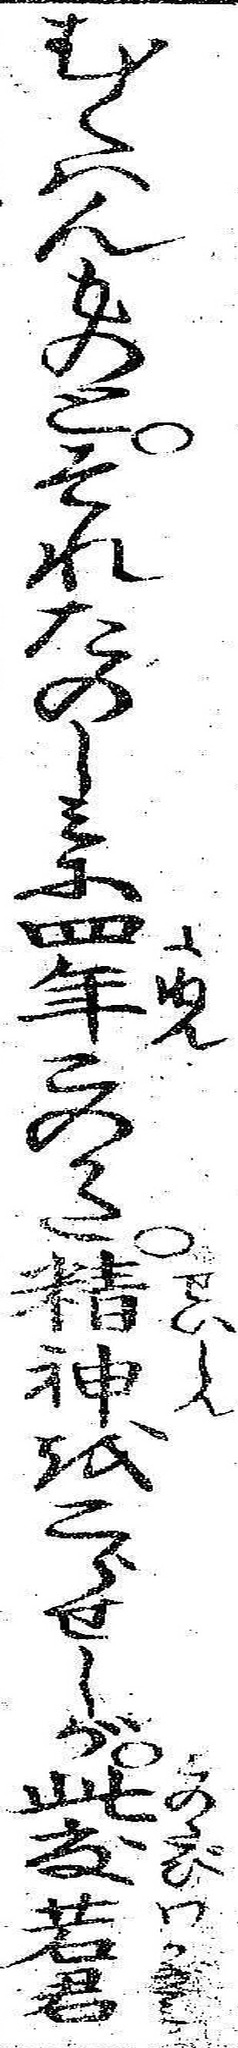むくはんものと。それたのしみに四年このかた。精神をこらせしが。此度若君
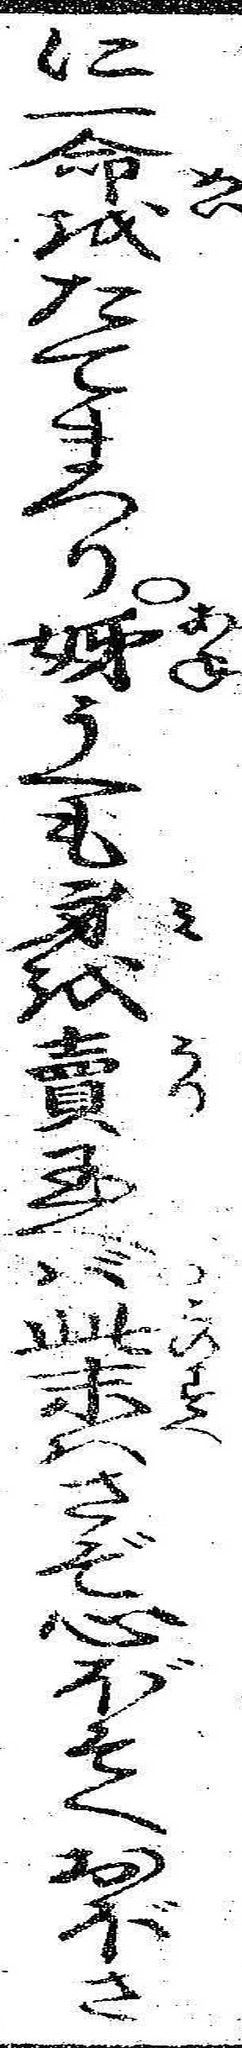に一命をたてまつり。姉うへも身を売玉へば。此末はさぞ心ぼそくおぼさ

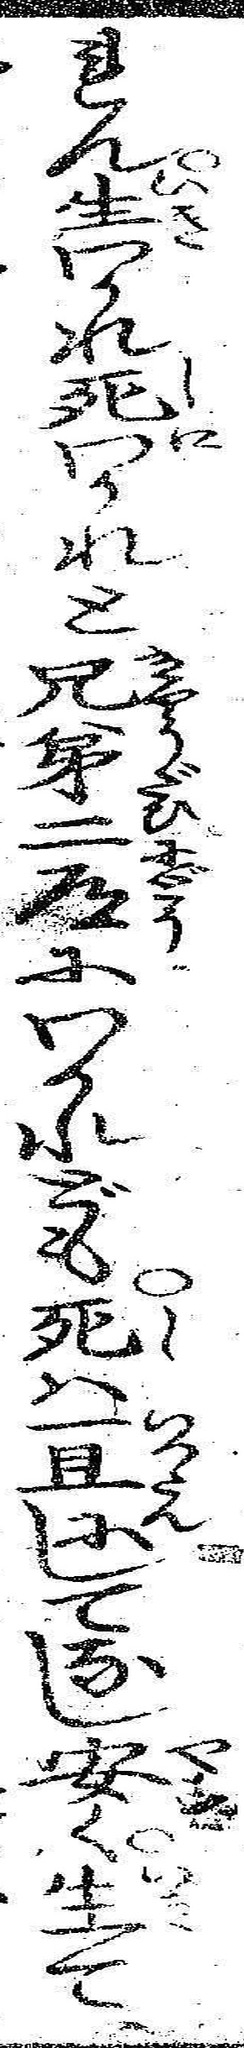れん。生わかれ死わかれと兄弟二道にわかれども。死は一且にしてなし安く。生て
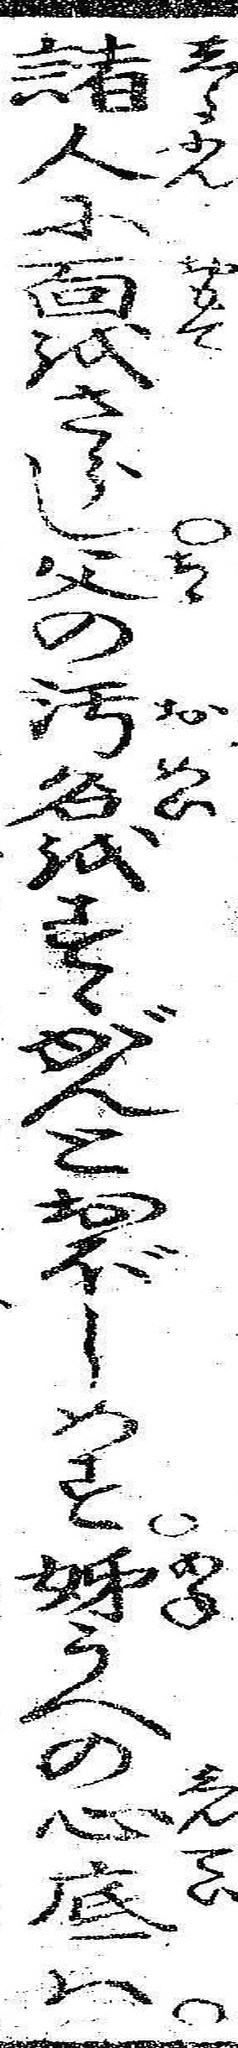諸人に面をさらし。父の汚名をすゝがんとおぼしめす。姉うへの心底は。
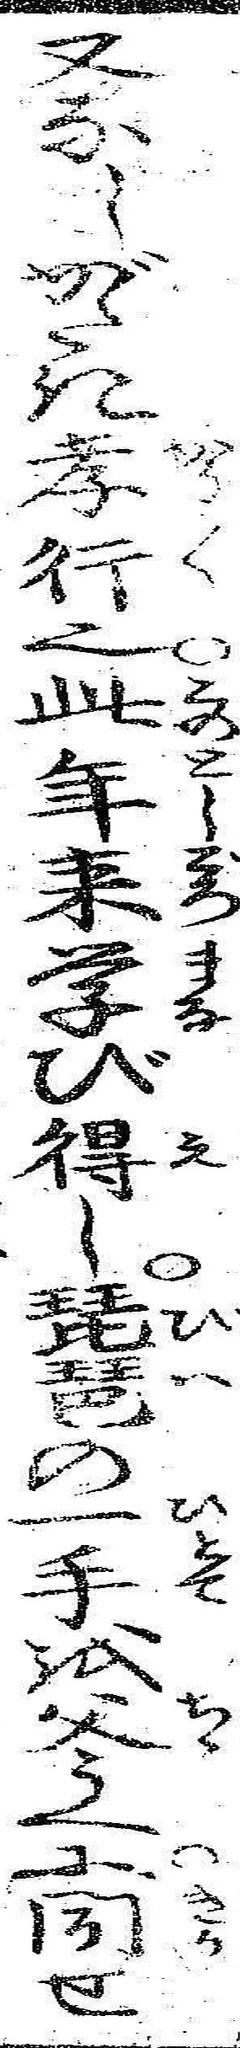又なしがたき孝行也。此年来学び得し。琵琶の一手を父うへに。聞せ
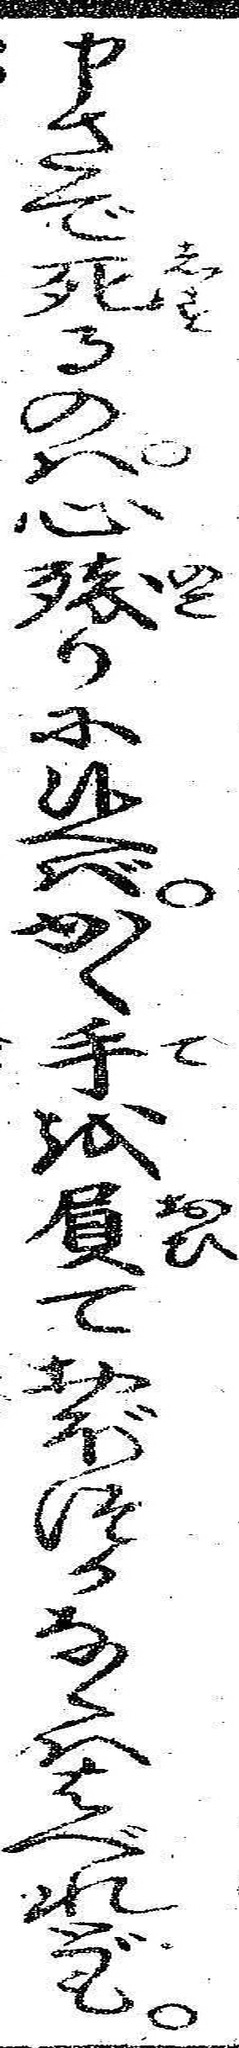申さで死るのは。心残りに候へば。かく手を屓ておぼつかなくははべれども。
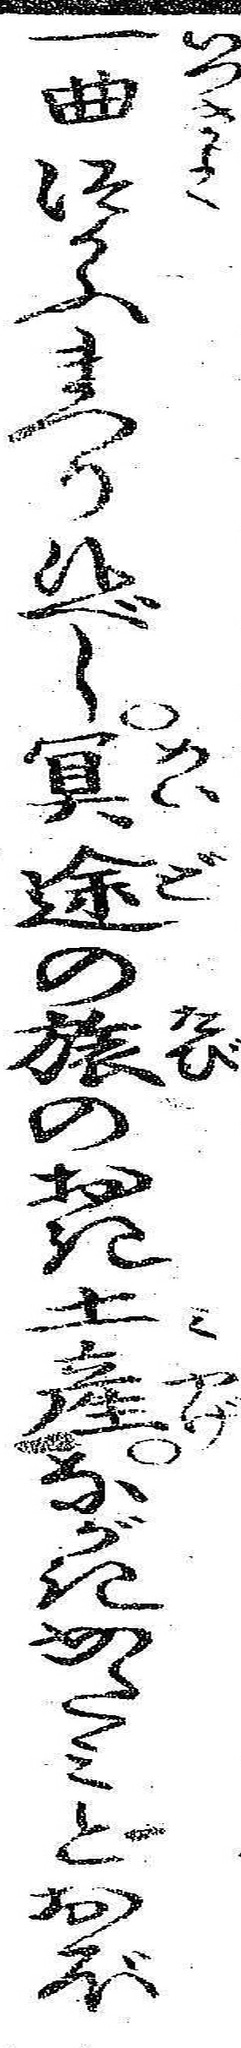一曲つかふまつり候べし。冥途の旅のおき土産。ながきかたみとおぼ
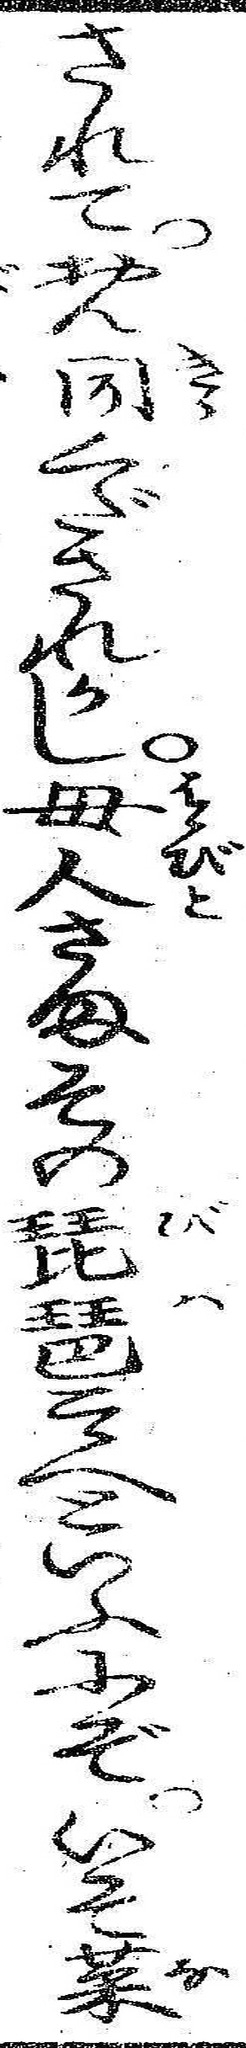されて。おん聞くだされかし。母人さまその琵琶こゝへといふにぞ。いそ菜
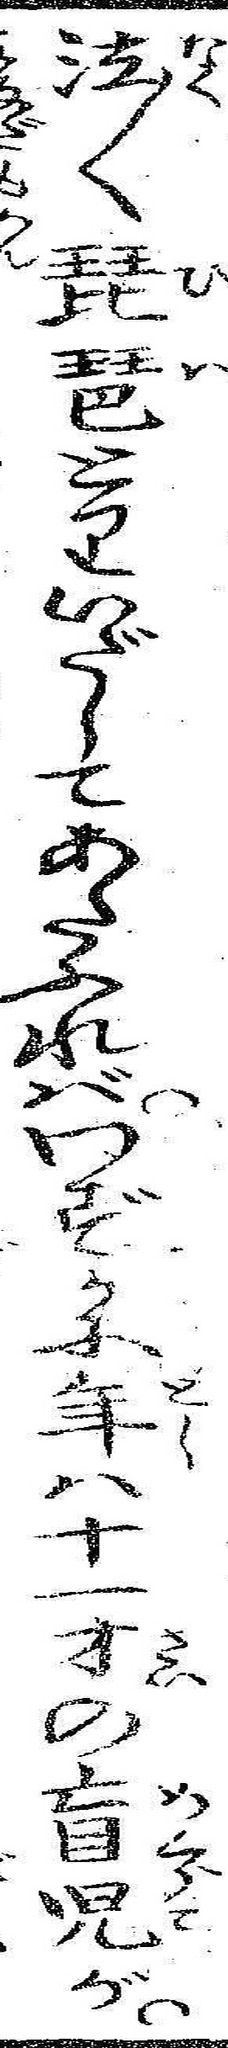泣〳〵琵琶とりいだしてあたふれば。わずかに年は十一才の盲児が。
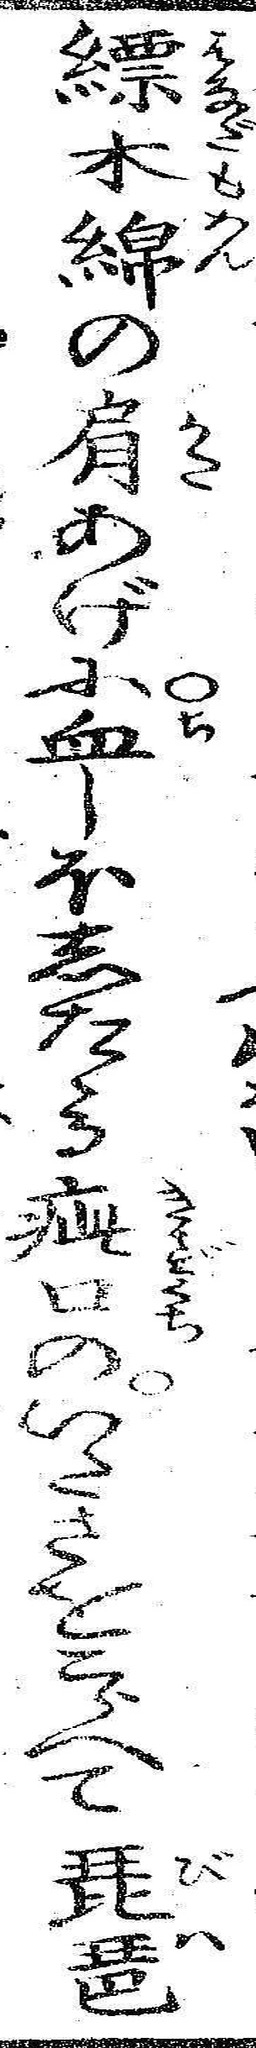縹木綿の肩あげに。血しほしたゝる疵口の。いたさをこらへて琵琶
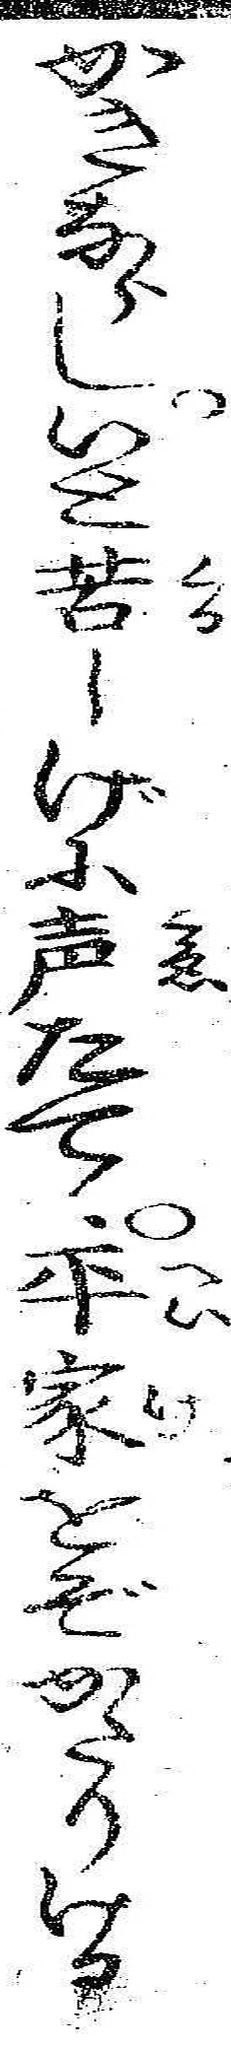かきならし。いと苦しげに声たてゝ。平家をぞかたりける
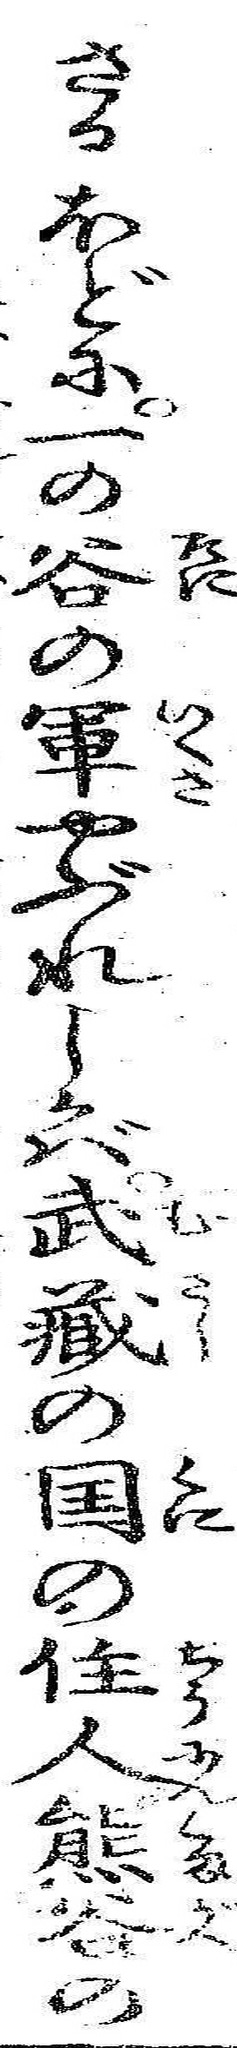さるほどに。一の谷の軍やぶれしかば。武蔵の国の住人熊谷の
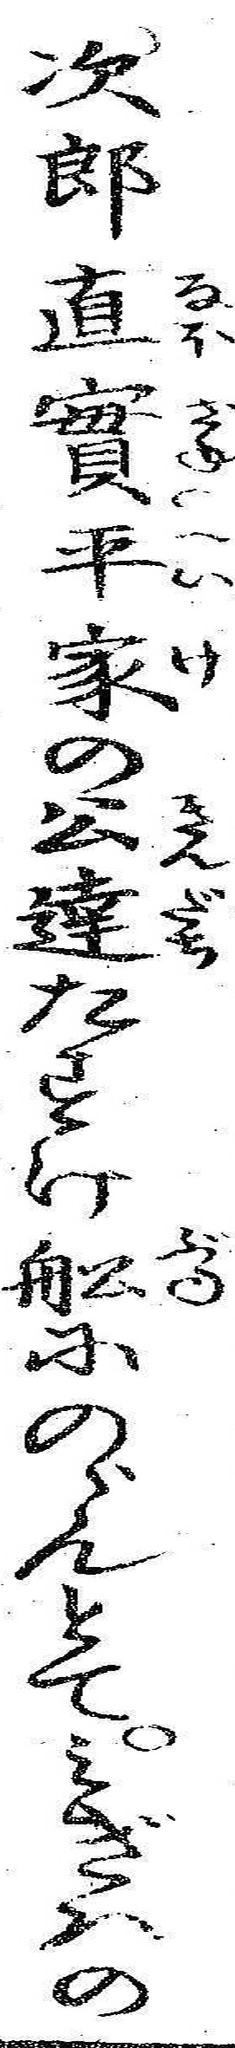次郎直実。平家の公達たすけ船にのらんとて。みぎはの
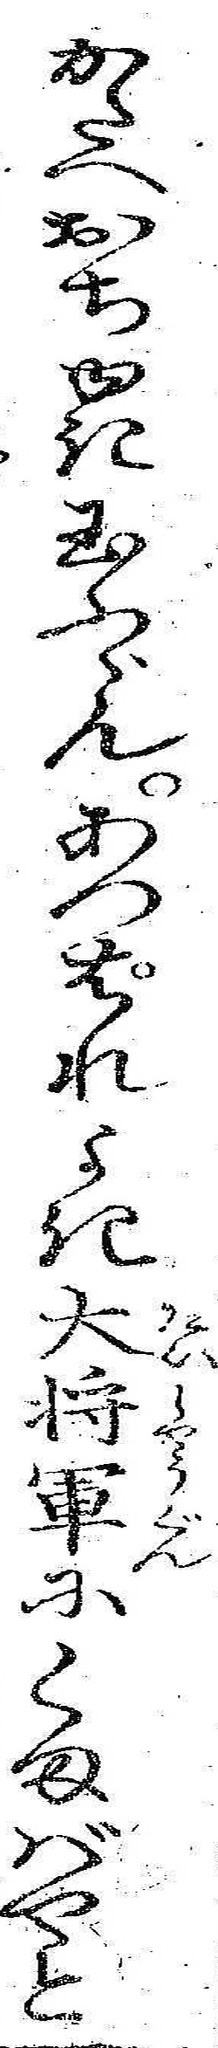かたへおちゆき玉ふらん。あつぱれよき大将軍にくまばやと
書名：昔話稲妻表紙
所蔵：国文学研究資料館
